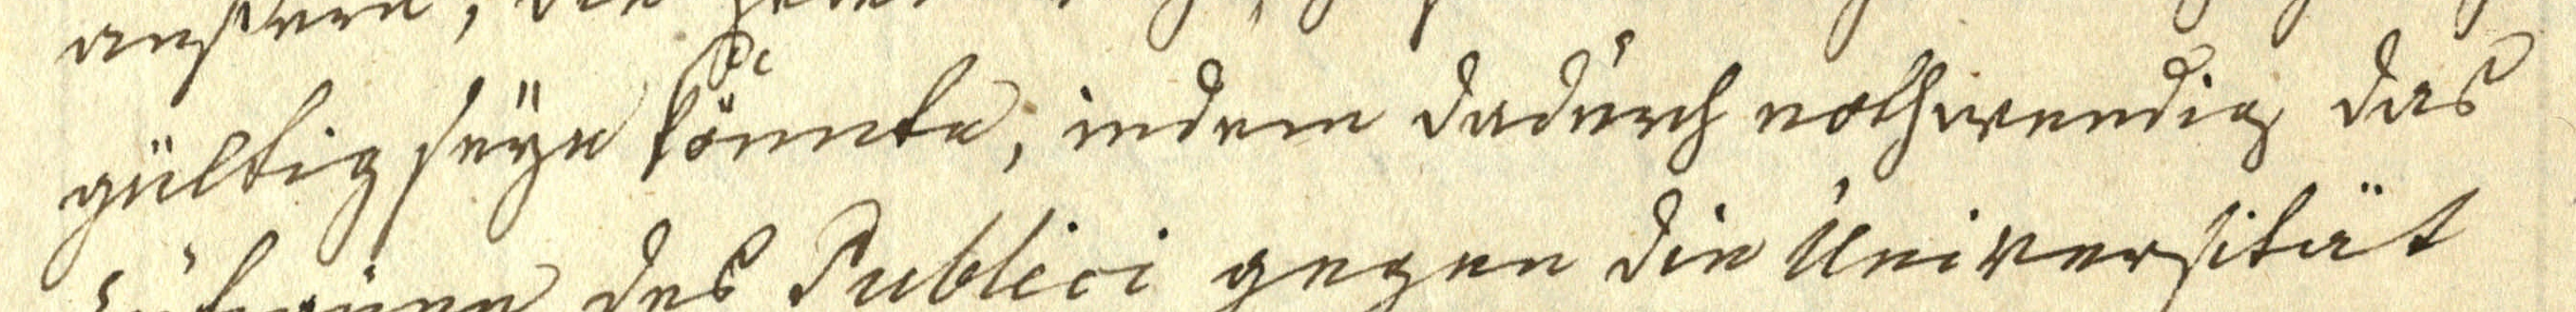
gültig seÿn könnte, indem dadurch nothwendig das
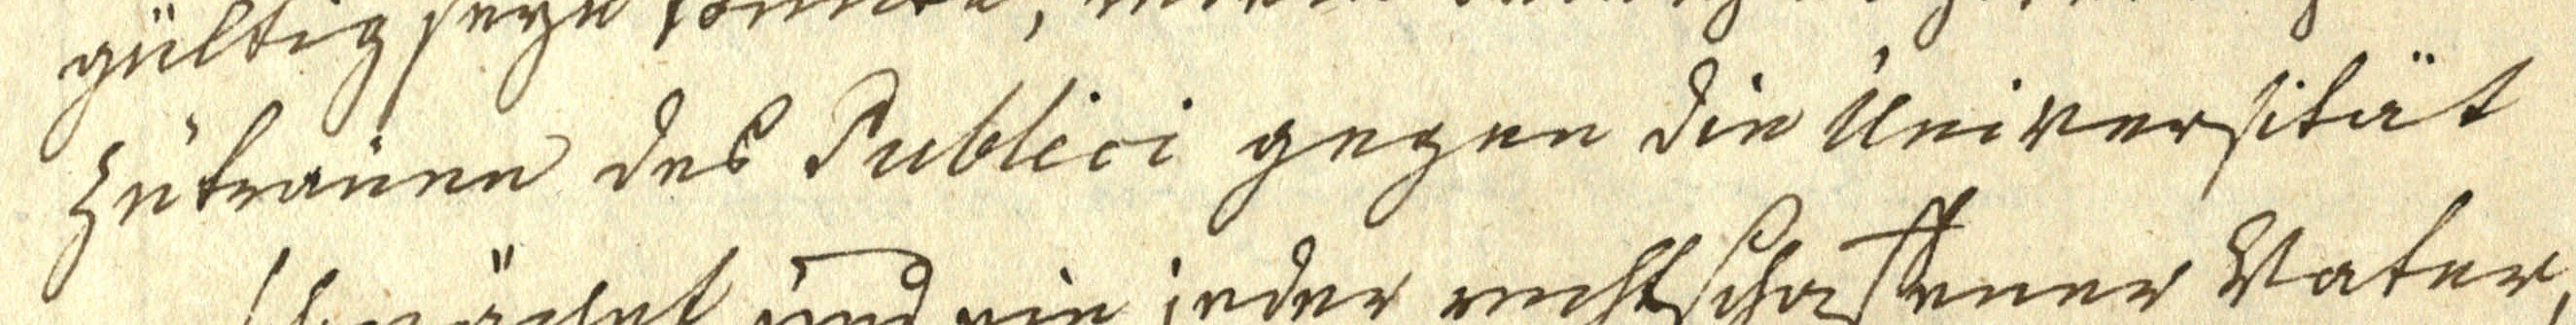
Zutrauen des Publici gegen die Universität
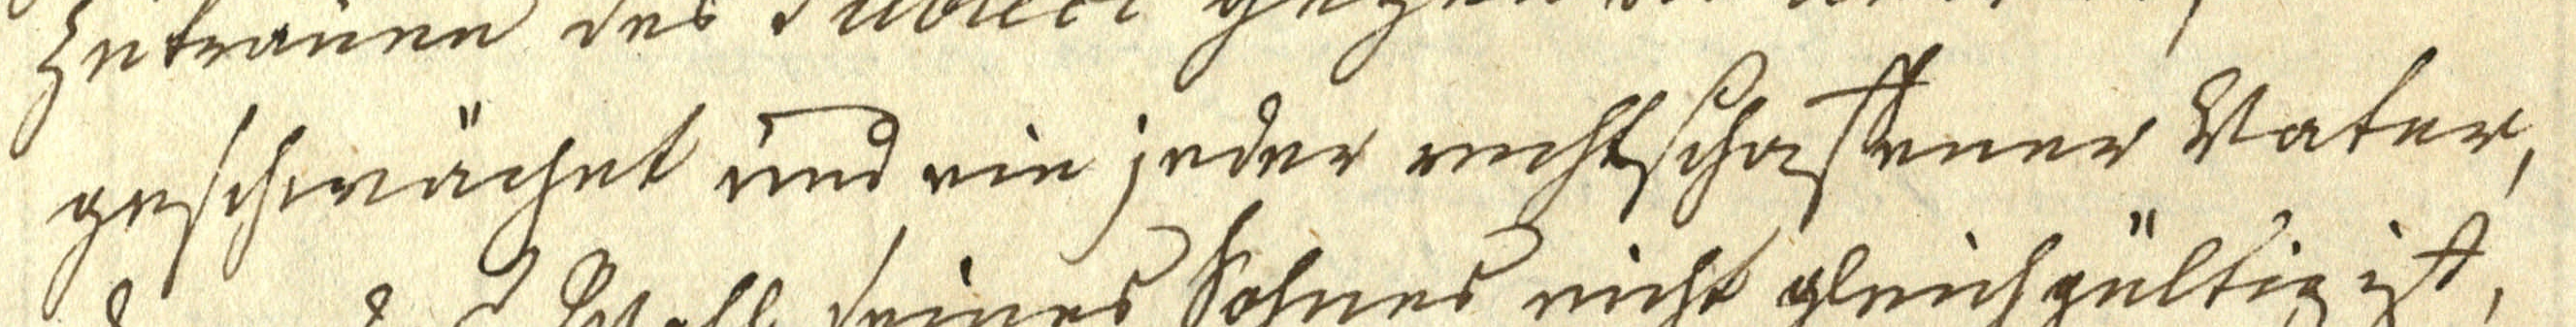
geschwächet und wie jeder rechtschaffener Vater,
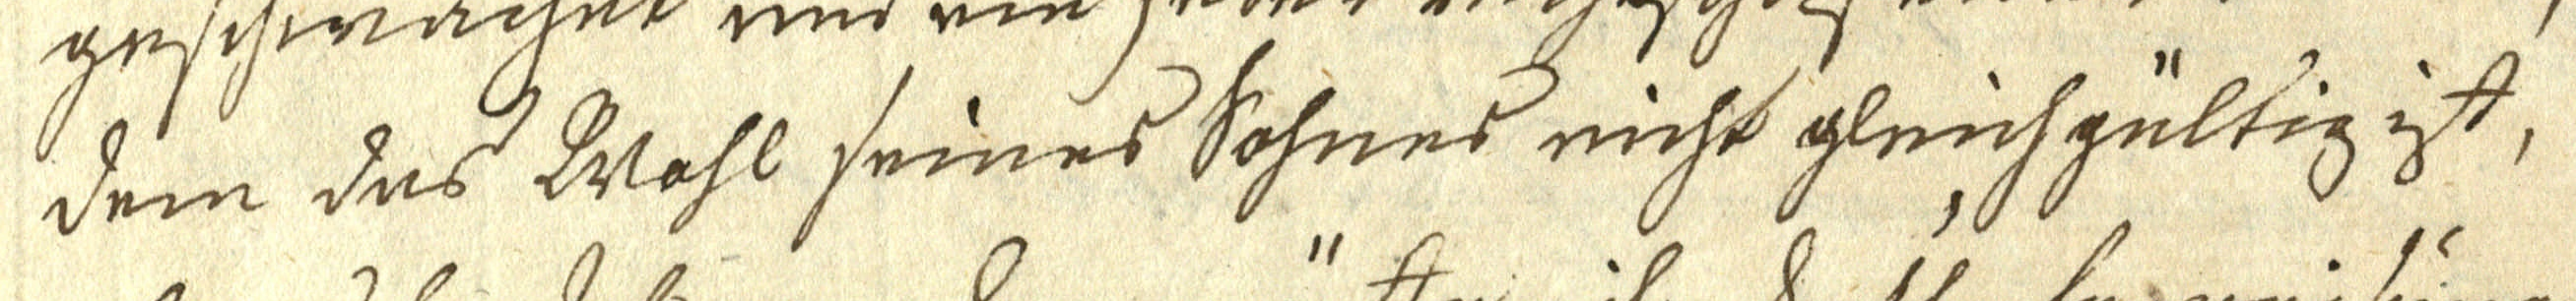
dem das Wohl seines Sohnes nicht gleichgültig ist,
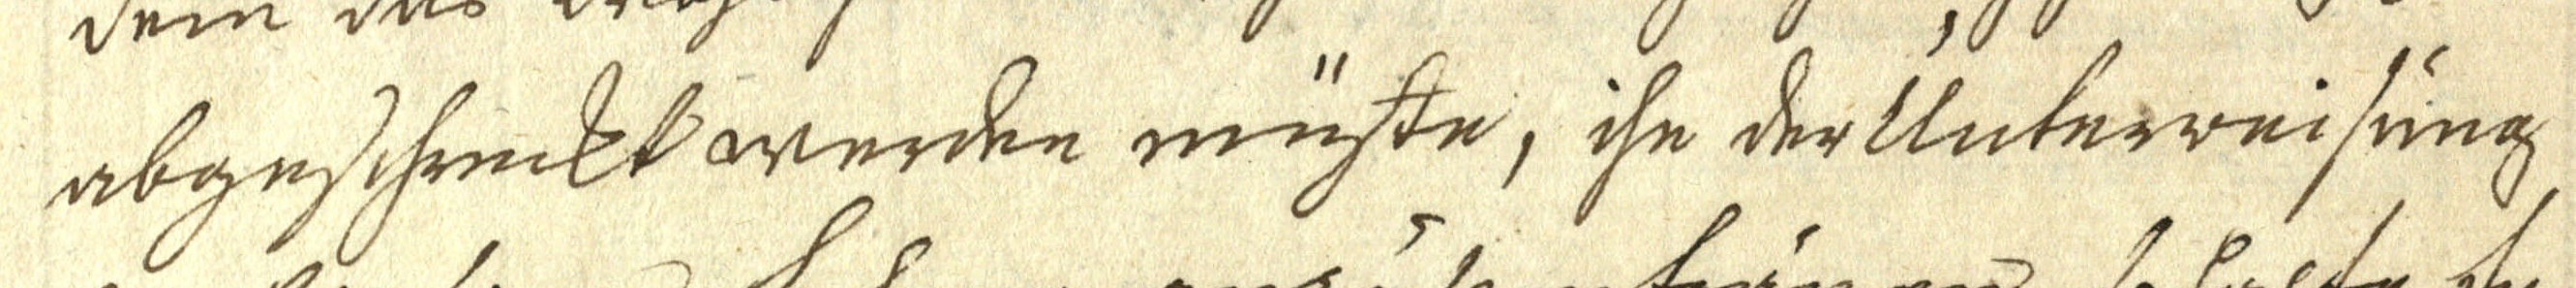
abgeschickt werden müste, ihn der Unterweisung
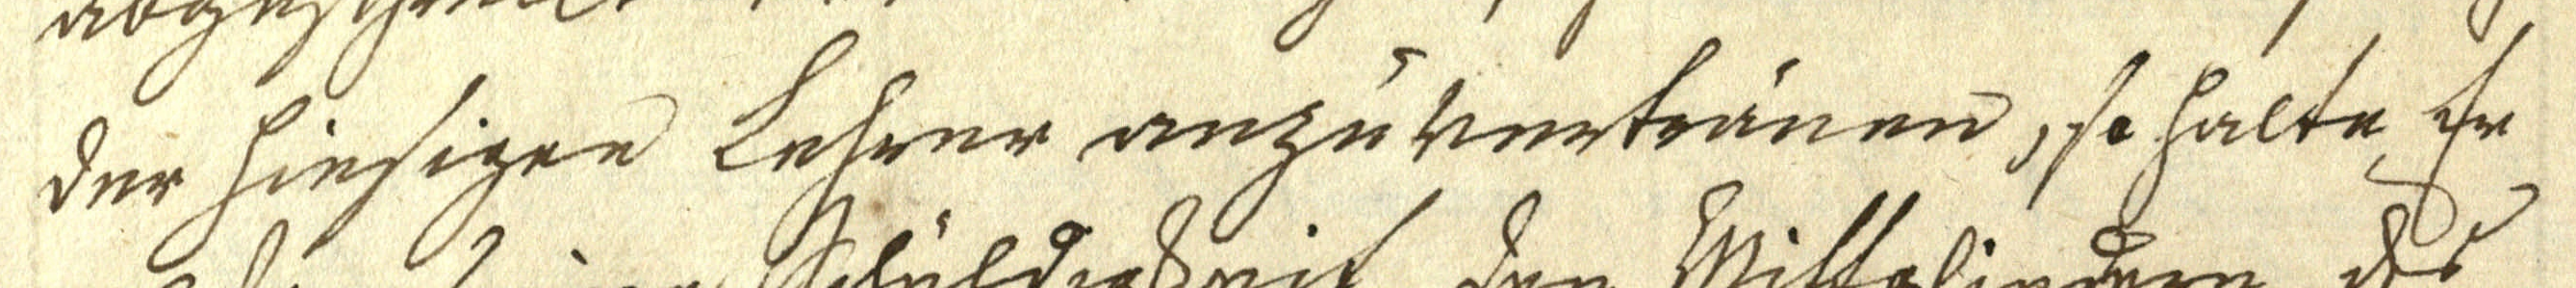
der hiesigen Lehrer anzuvertrauen, so halte Er
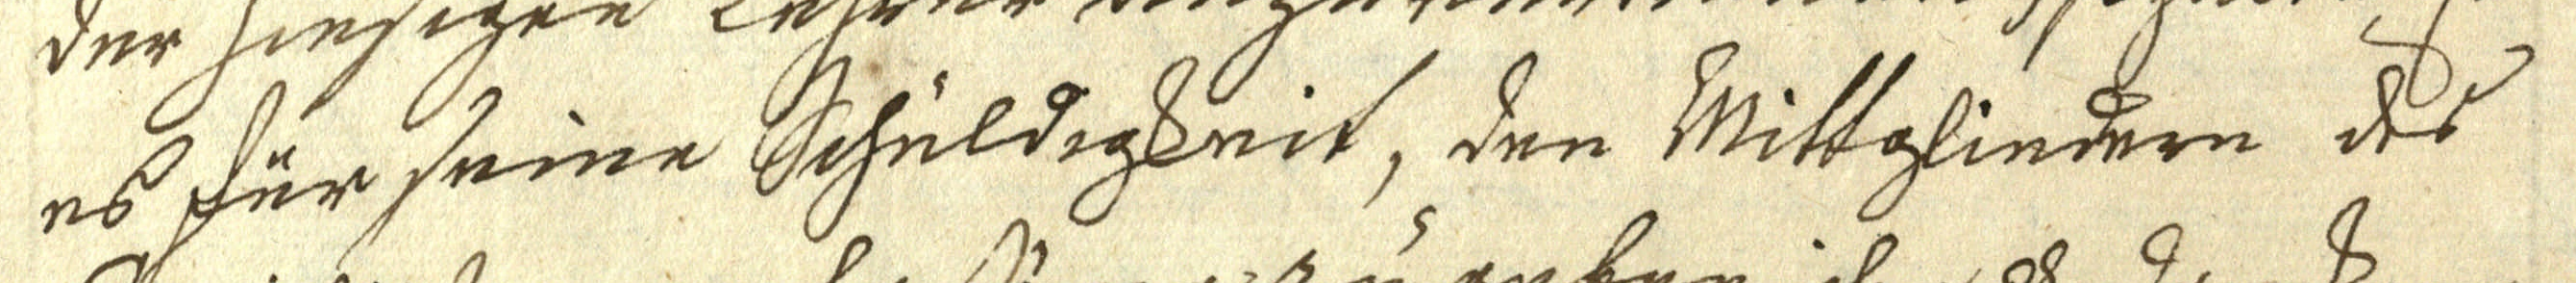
es für seine Schuldigkeit, den Mittgliedern des
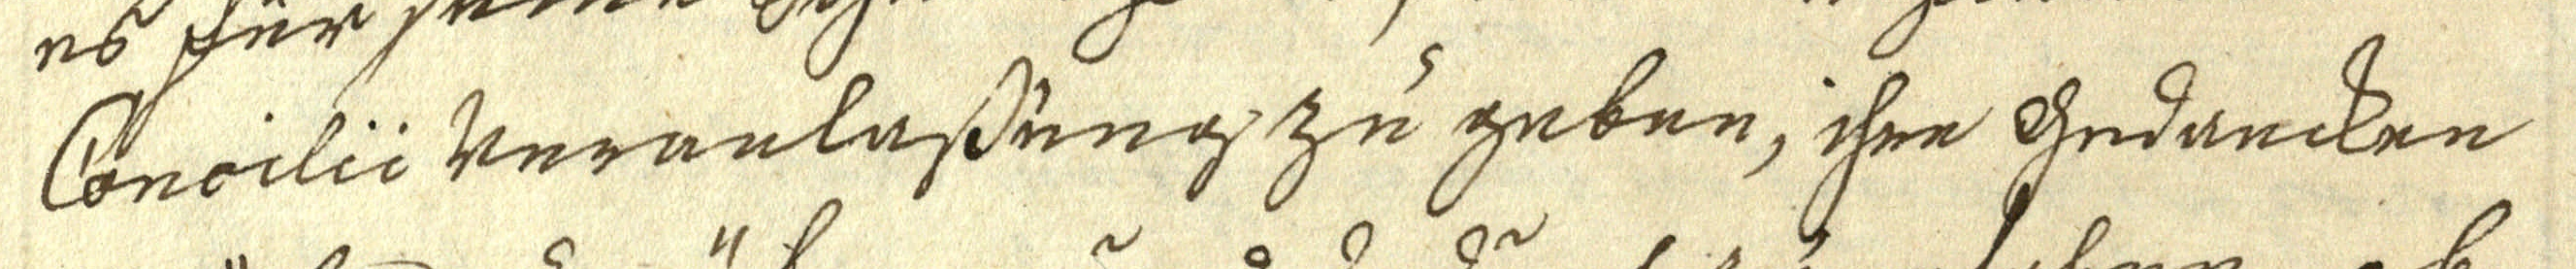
Concilii Veranlaßung zu geben, ihre Gedancken
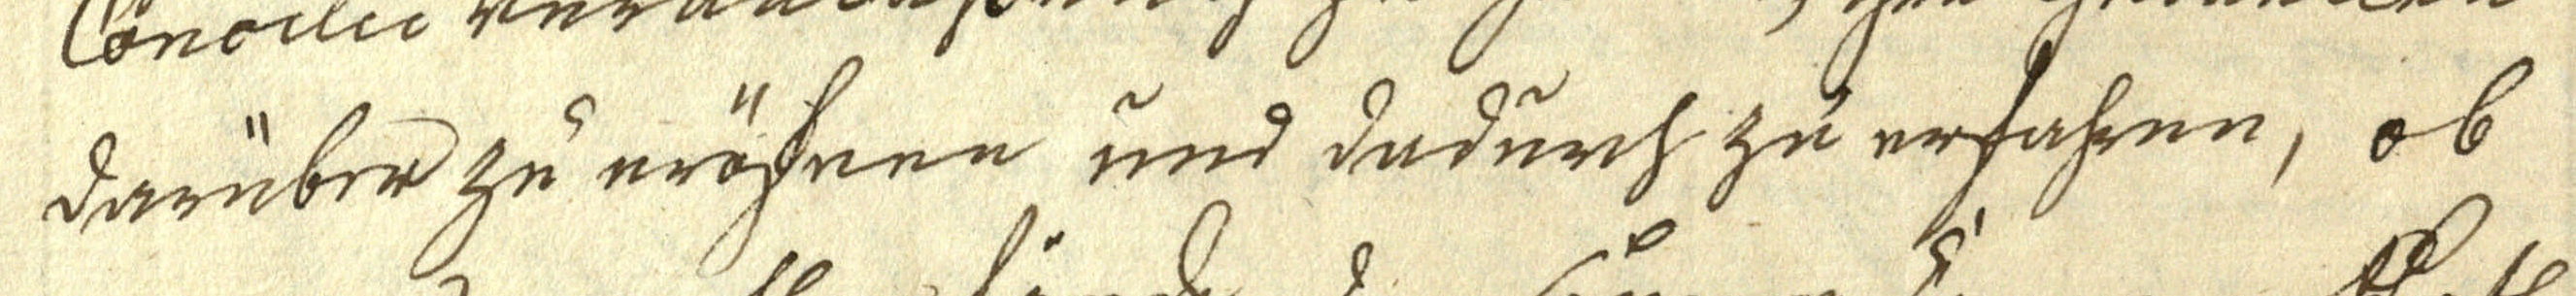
darüber zu eröfnen und dadurch zu erfahren, ob
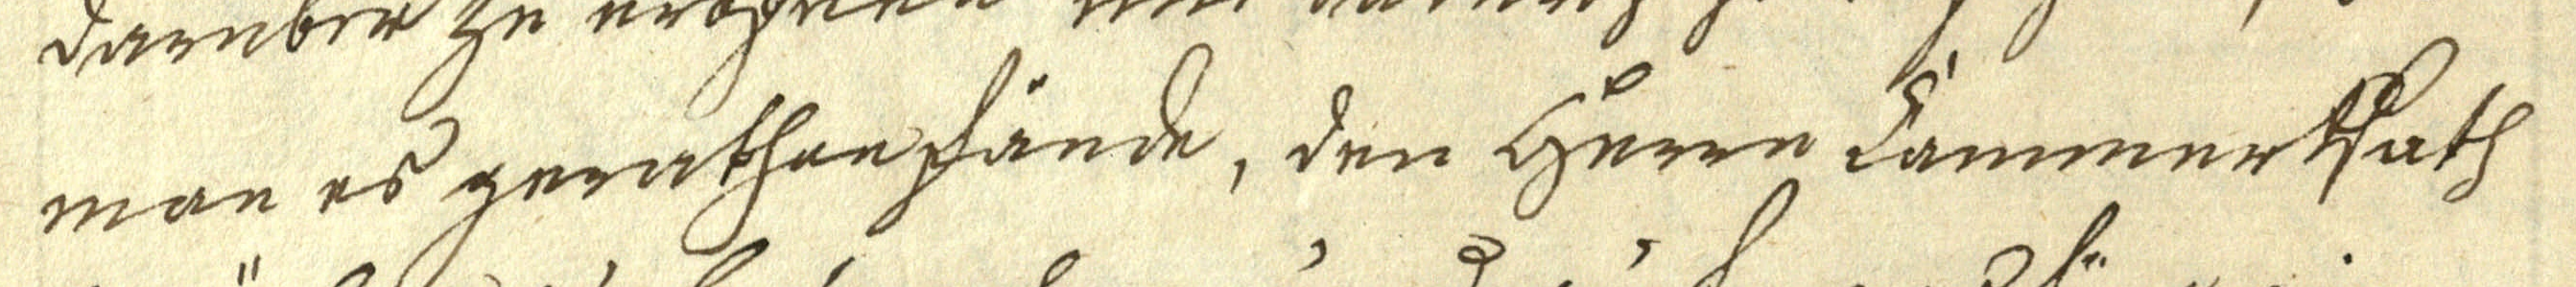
man es gerathen fände, den Herrn CammerRath
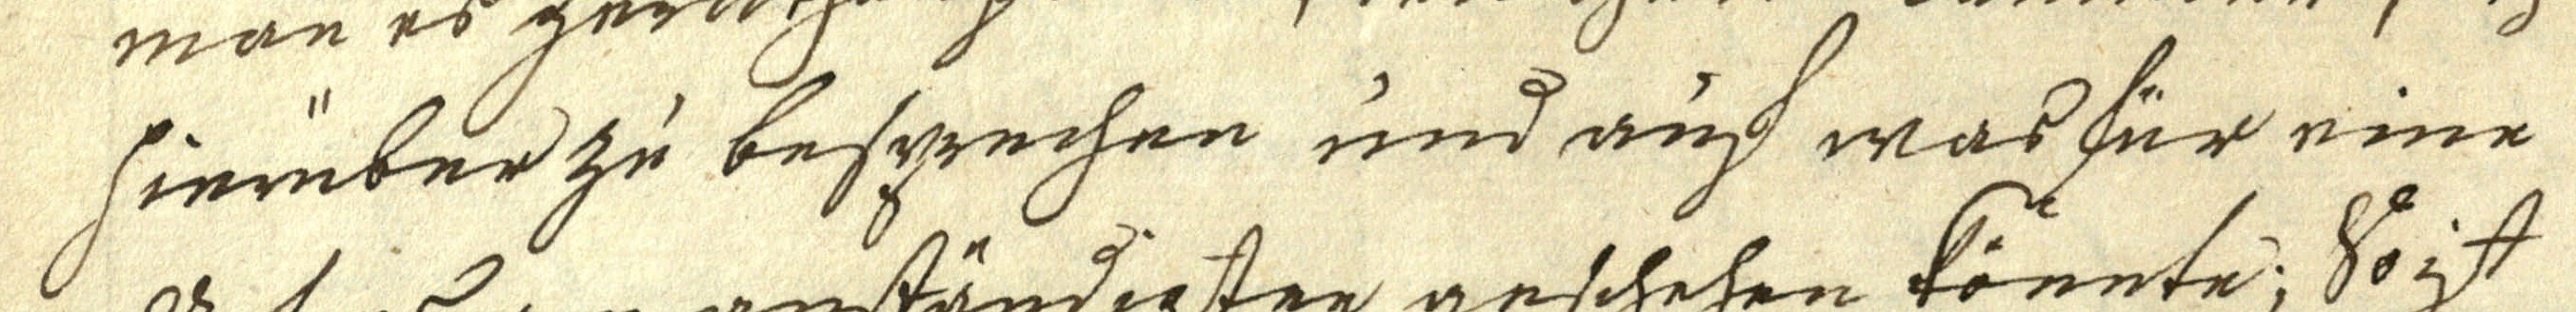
hierüber zu besprechen und auf was für eine
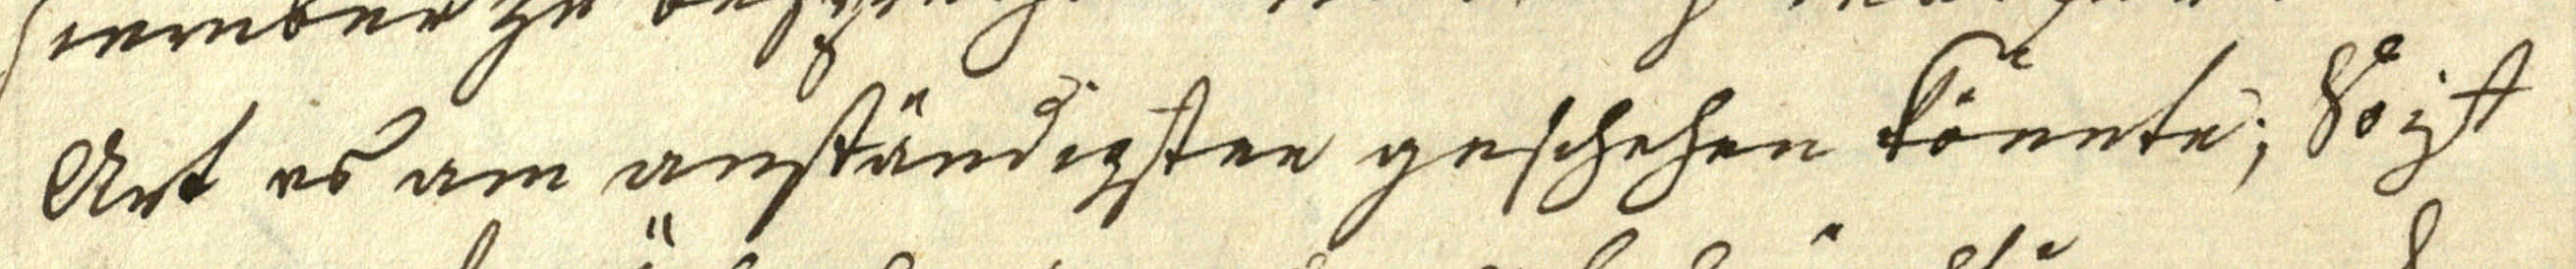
Art es am anständigsten geschehen könnte; So ist
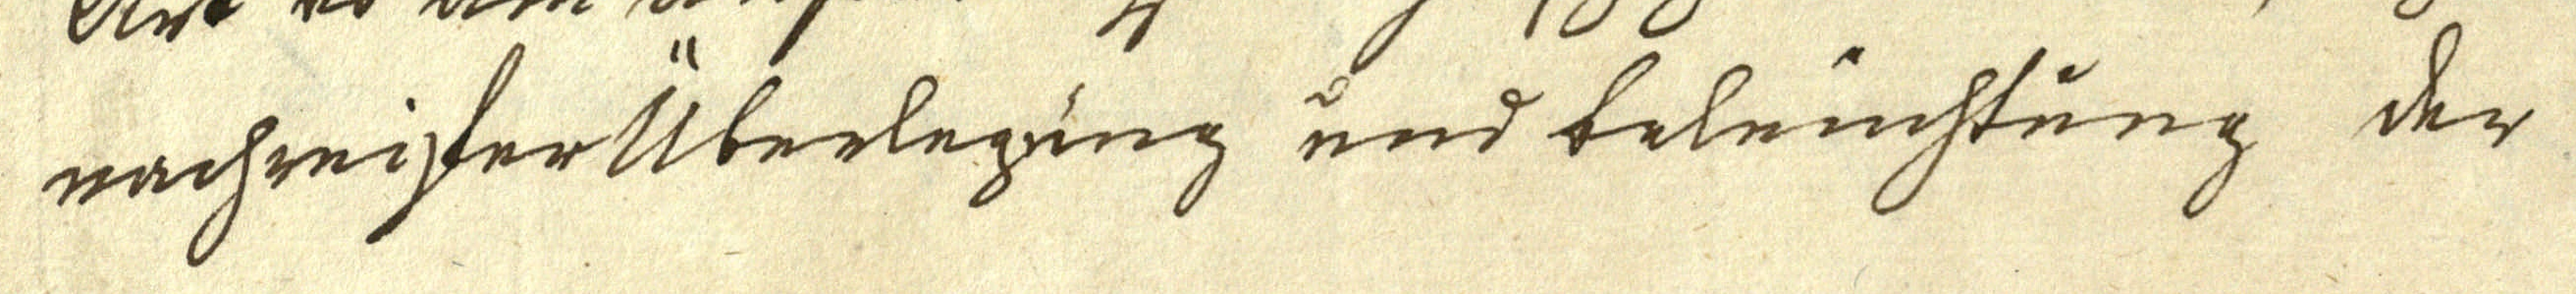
nach reifer Überlegung und Beleuchtung der
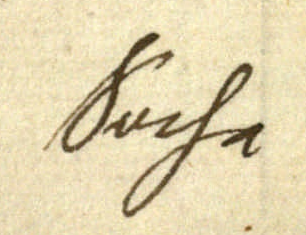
Sache
